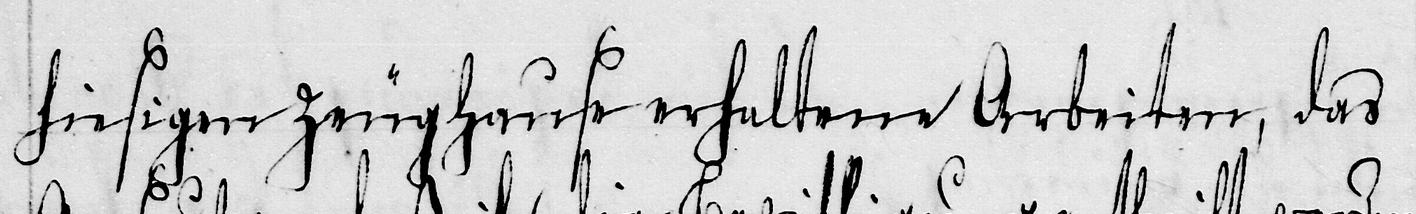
hiesigen Zeughause erhaltene Arbeiten, das
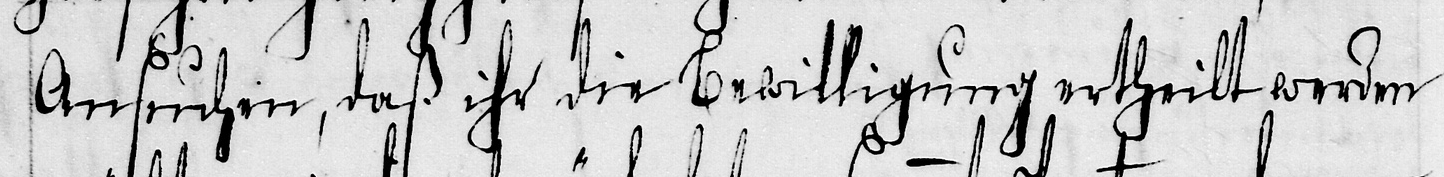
Ansuchen, daß ihr die Bewilligung ertheilt werden
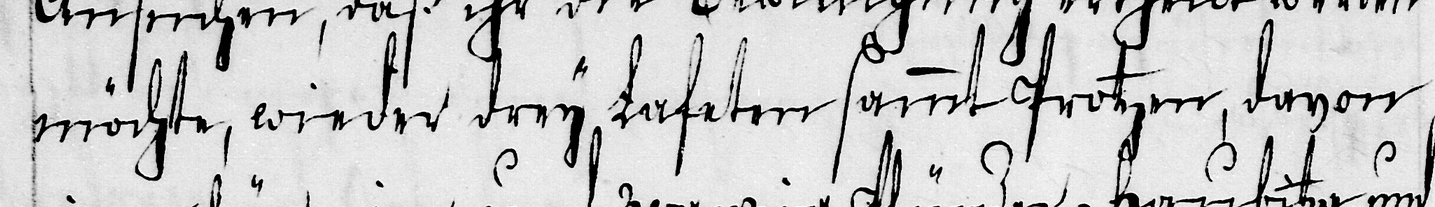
möchte, wieder drey Lafeten sammt Protzen, davon
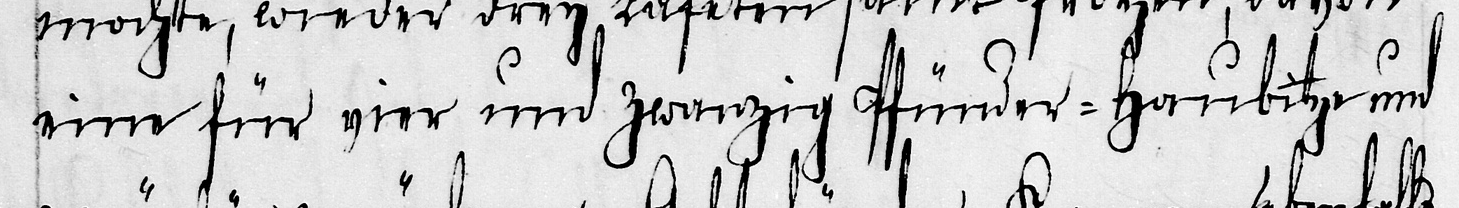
eine für vier und zwanzig Pfünder-Haubitze und
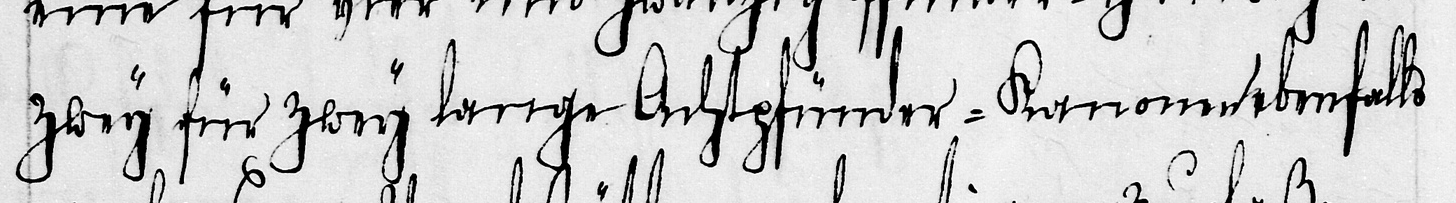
zwey für zwey lange Achtpfünder-Kanonen ebenfalls
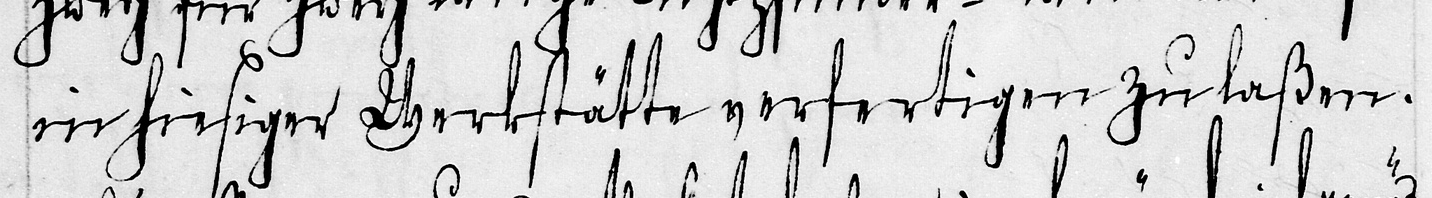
in hiesiger Werkstätte verfertigen zu laßen.
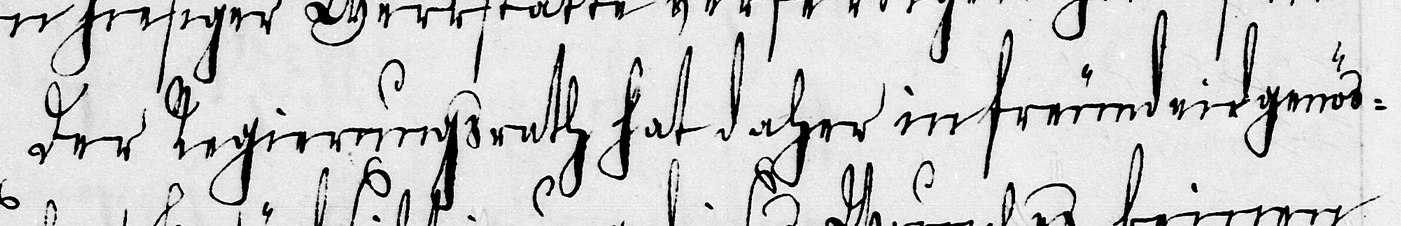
Der Regierungsrath hat daher in freundeidgenö¬
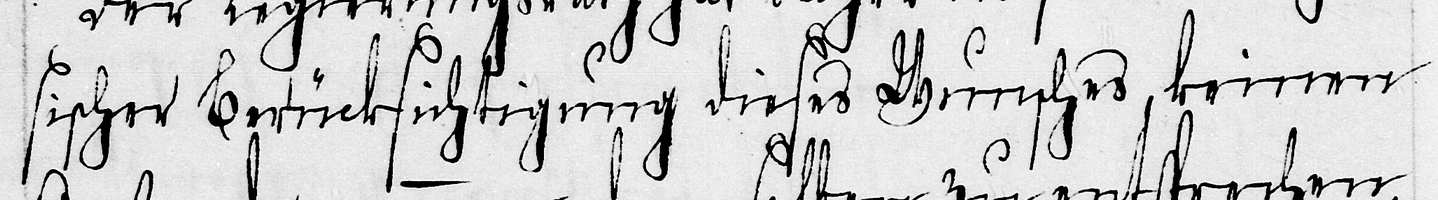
ßischer Berücksichtigung dieses Wunsches, keinen
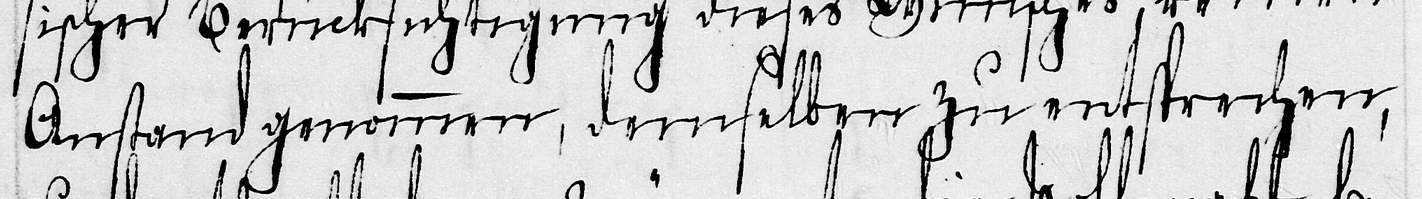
Anstand genommen, demselben zu entsprechen,
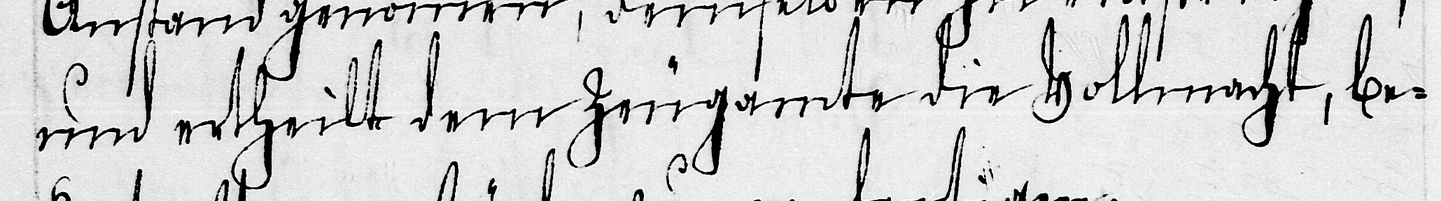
und ertheilt dem Zeugamte die Vollmacht, be¬
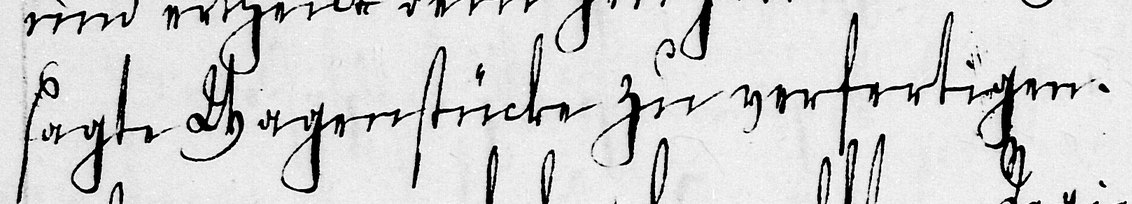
sagte Wagenstücke zu verfertigen.
